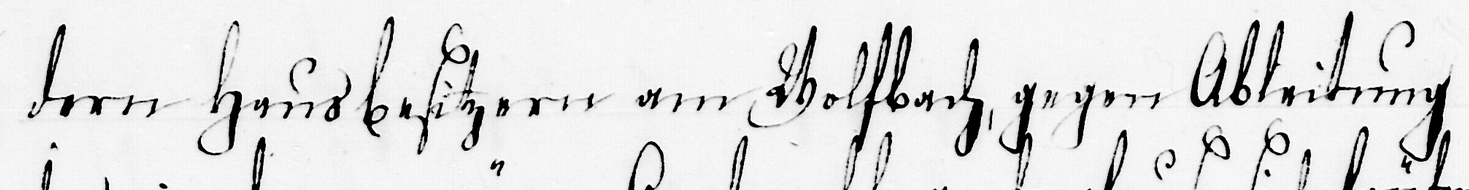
dern Hausbesitzern am Wolfbach, gegen Ableitung
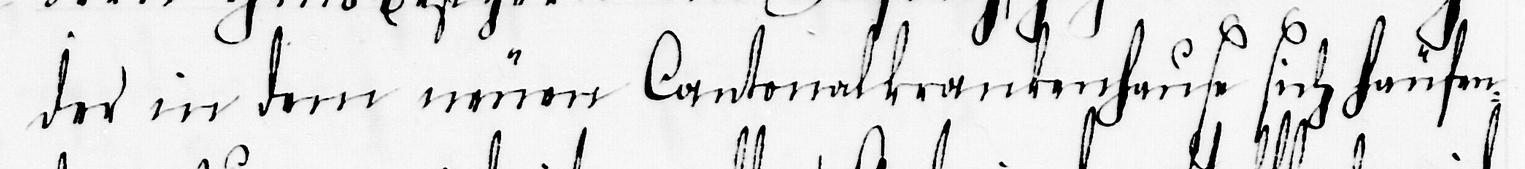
der in dem neuen Cantonalkrankenhause sich häufen¬
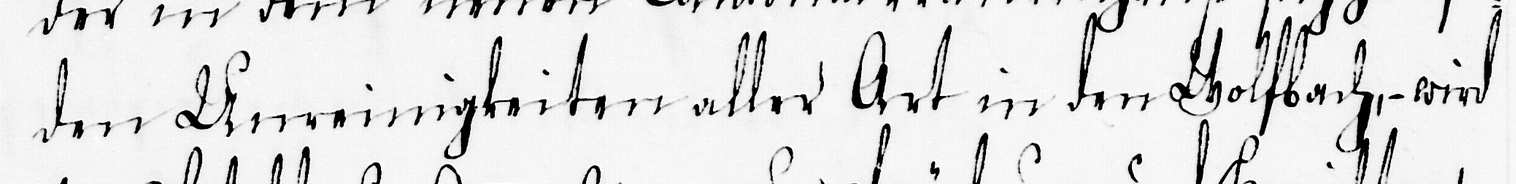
den Unreinigkeiten aller Art in den Wolfbach, – wird
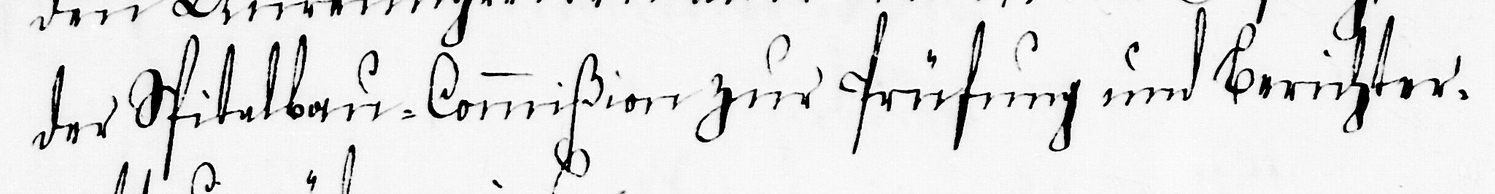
der Spitalbau-Commißion zur Prüfung und Berichter¬
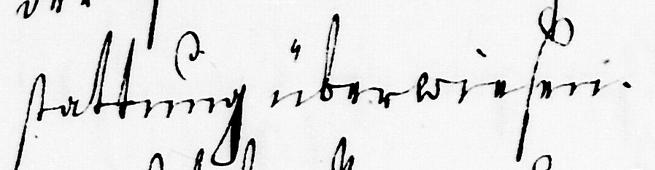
stattung überwiesen.
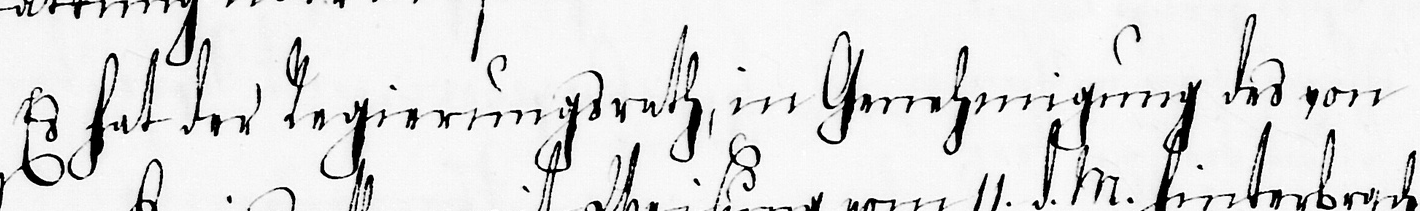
Es hat der Regierungsrath, in Genehmigung des von
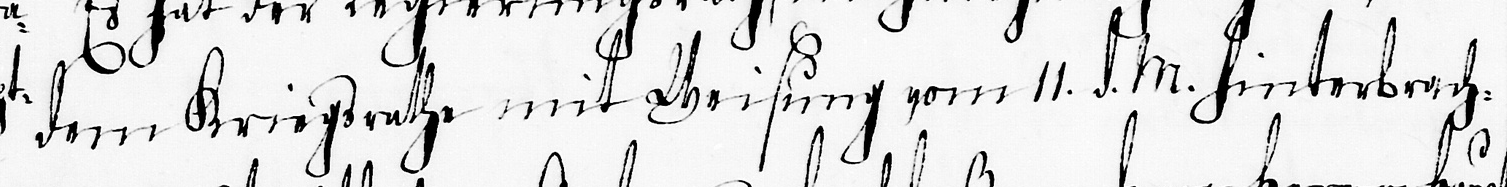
dem Kriegsrathe mit Weisung vom 11. d. M. hinterbrach¬
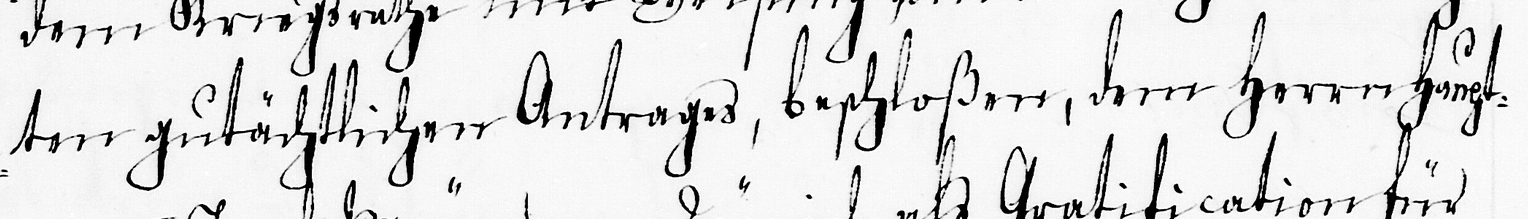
ten gutächtlichen Antrages, beschloßen, dem Herrn Haupt¬
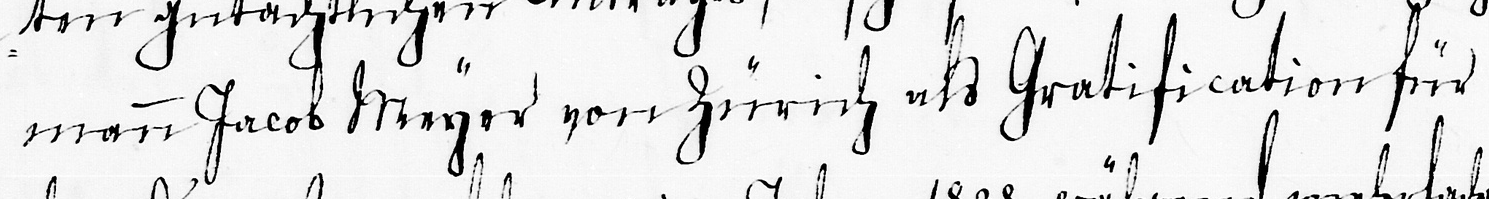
mann Jacob Meyer von Zürich als Gratification für
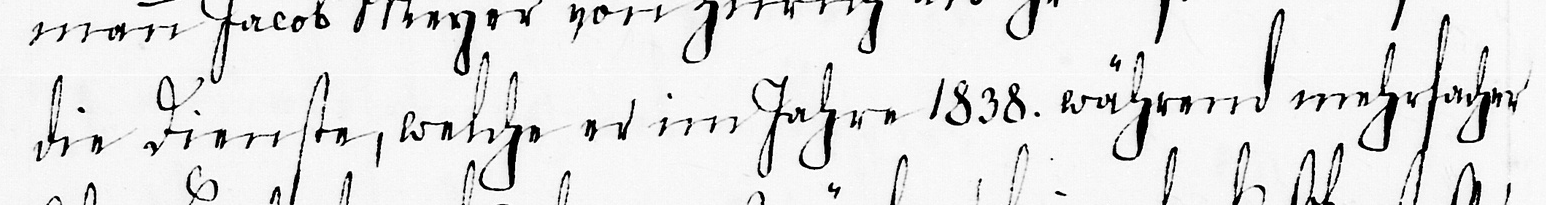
die Dienste, welche er im Jahre 1838. während mehrfacher
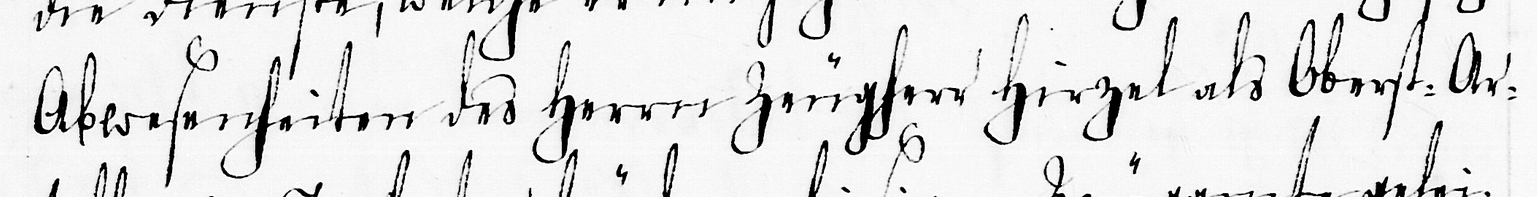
Abwesenheiten des Herrn Zeugherr Hirzel als Oberst-Ar¬
